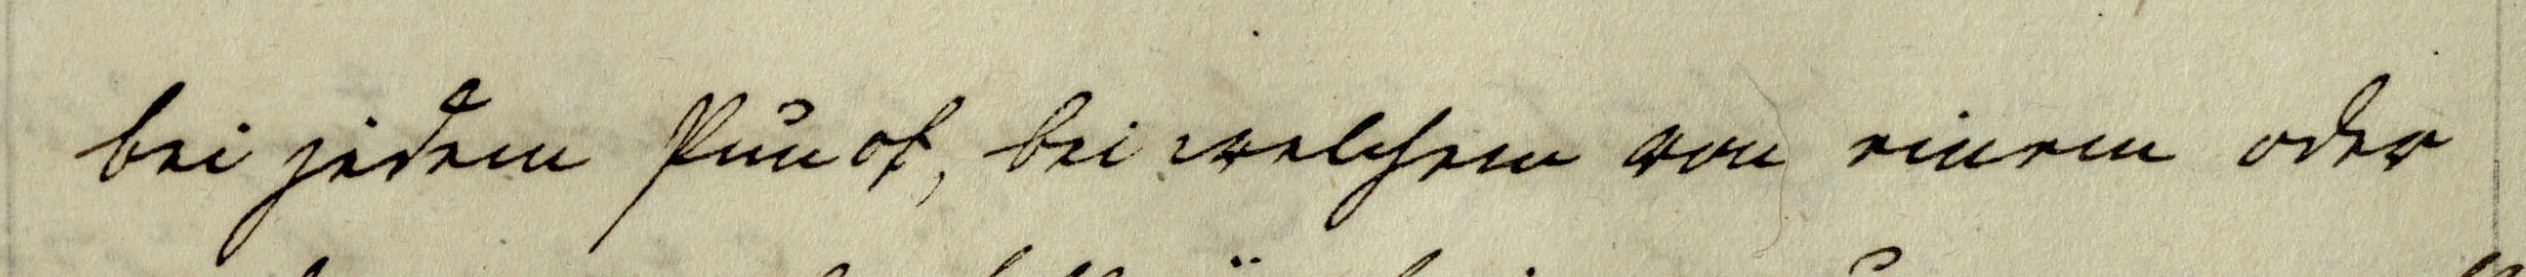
bei jedem Punct, bei welchem von einem oder
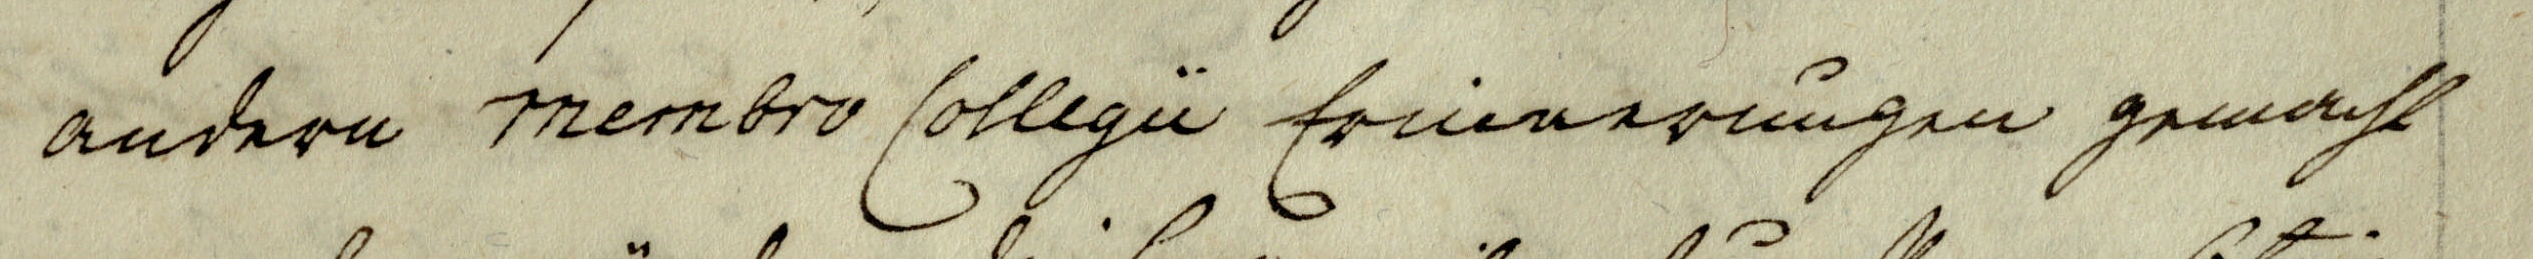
andern membro Collegii Erinnerungen gemacht
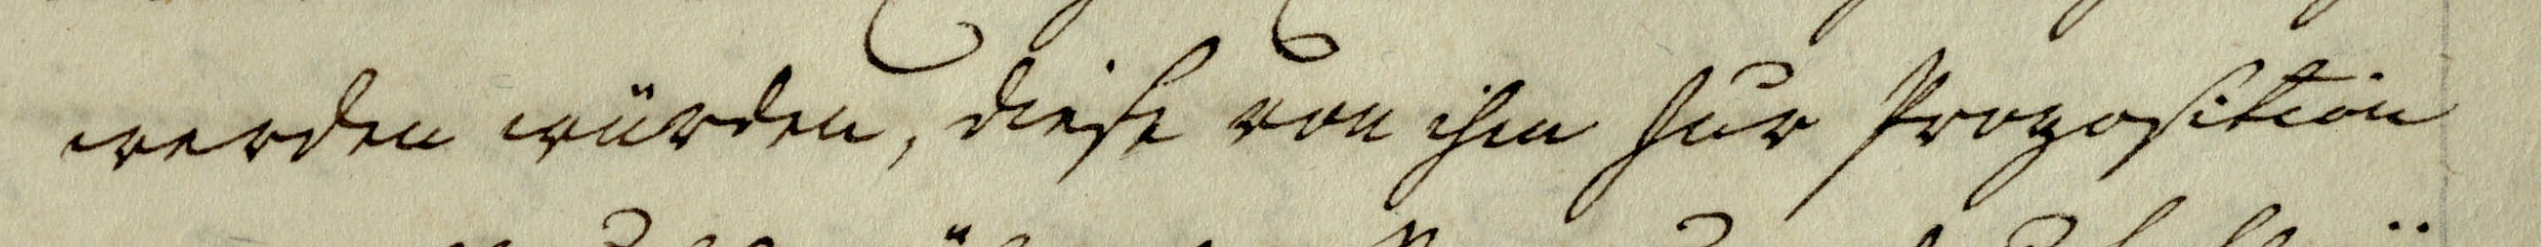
werden würden, diese von ihm zur Proposition
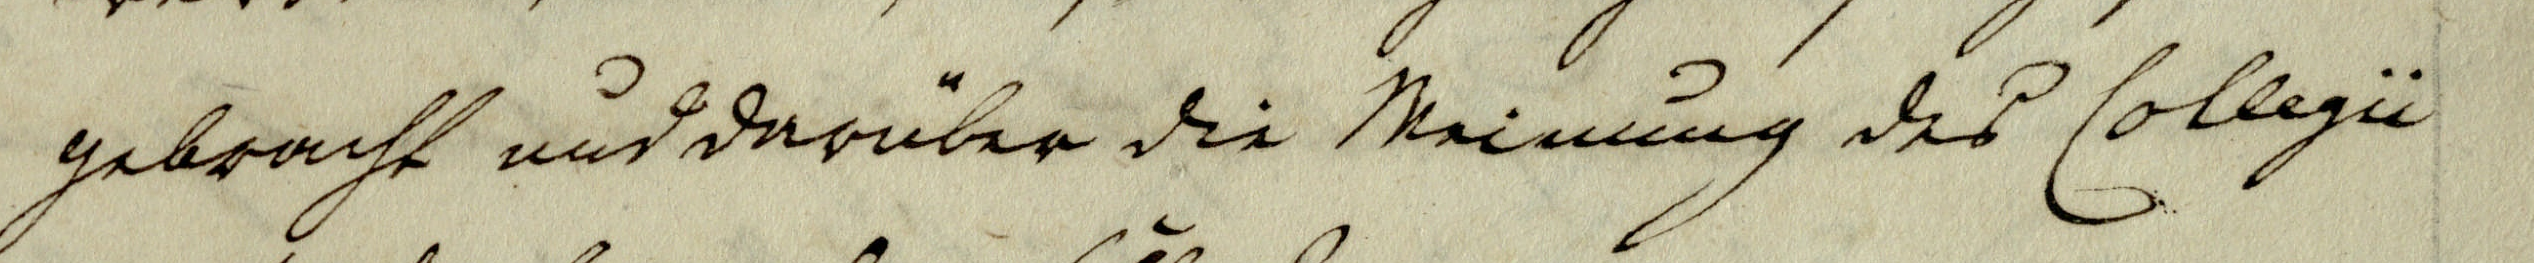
gebracht und darüber die Meinung des Collegii
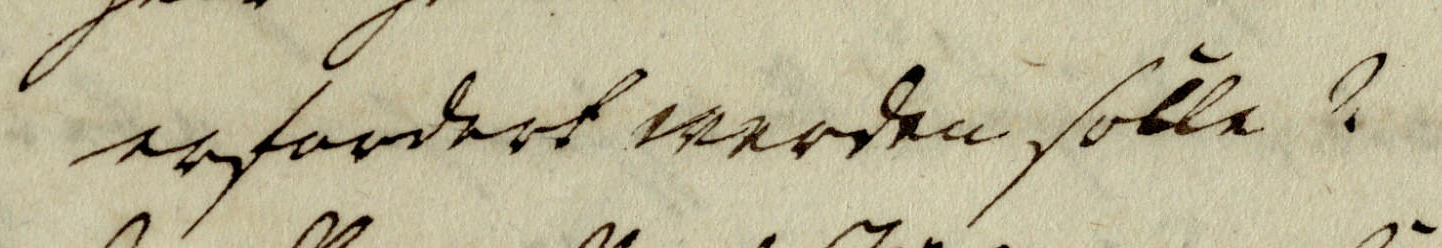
erfordert werden solle?
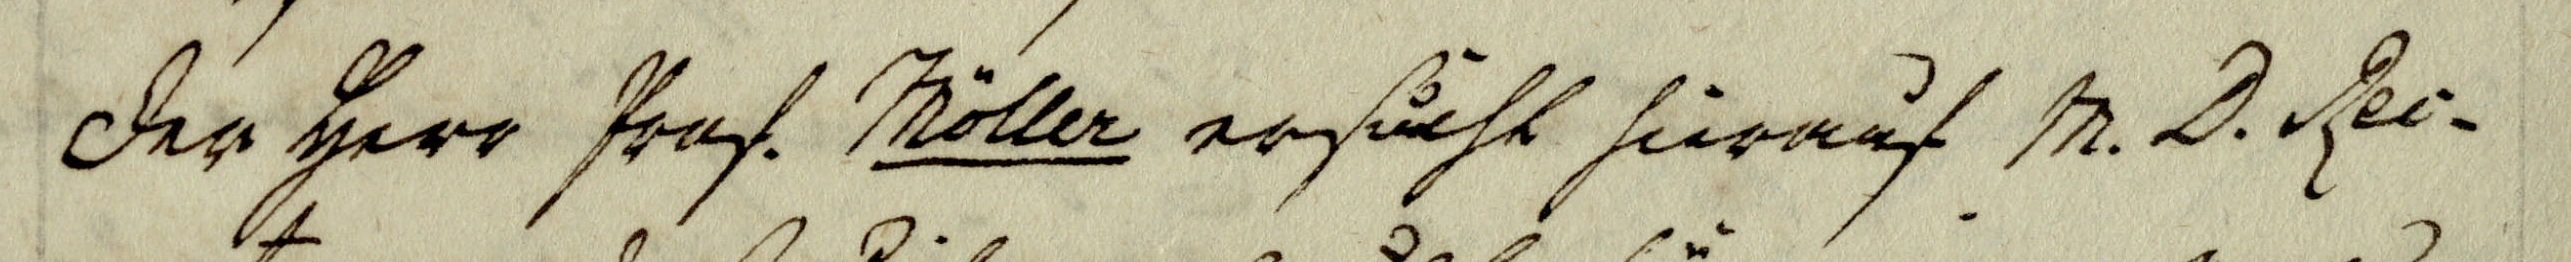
Der Herr Prof. Möller ersucht hierauf M. D. Rec¬
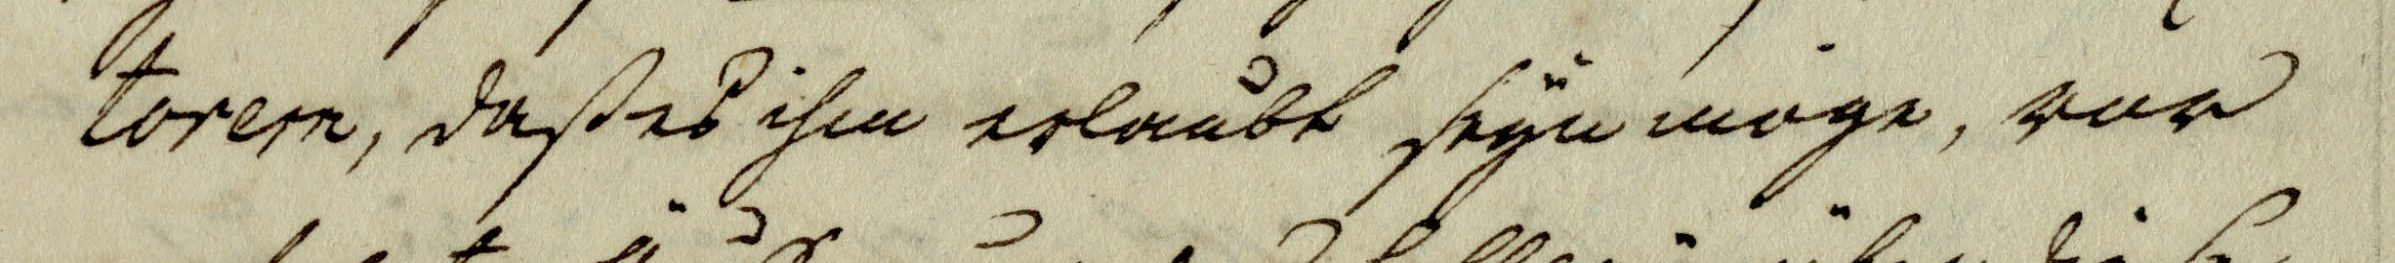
torem, daß es ihm erlaubt seÿn möge, vor
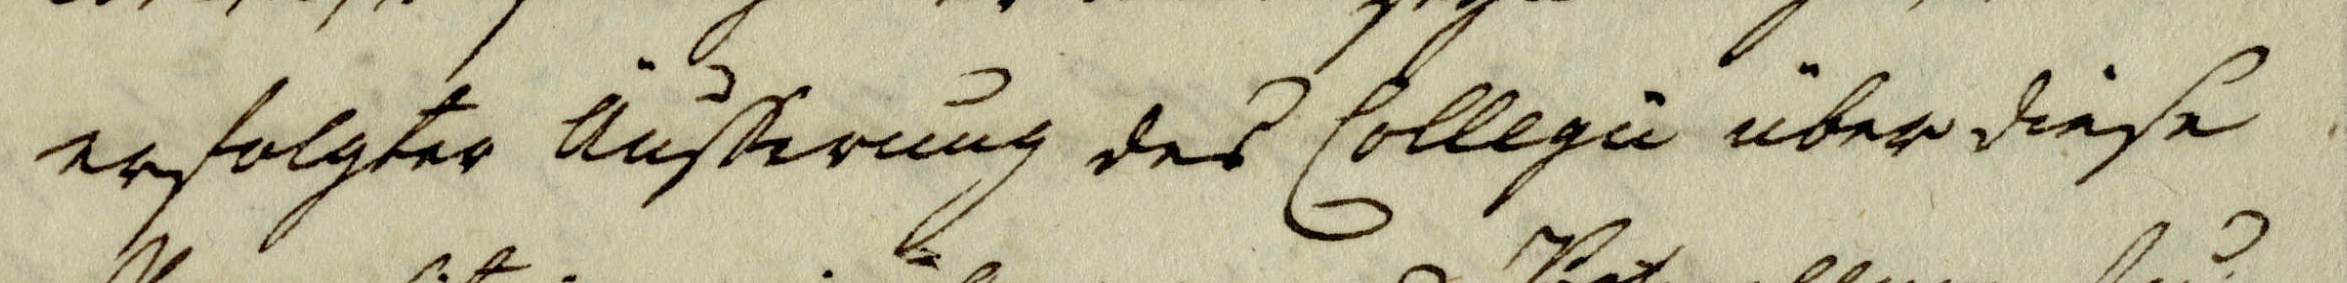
erfolgter Äusserung des Collegii über diese
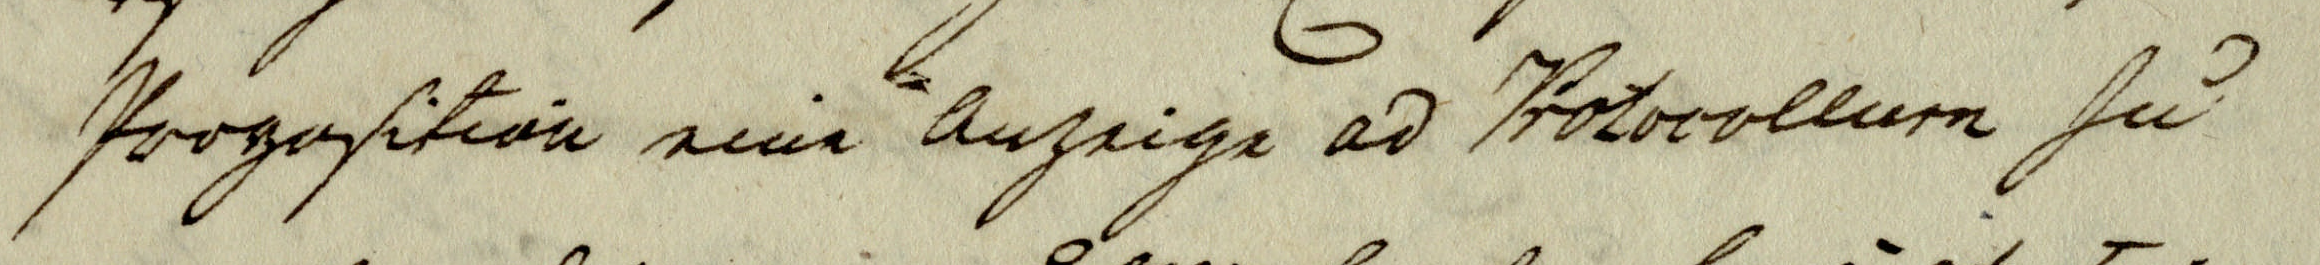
Proposition eine Anzeige ad Protocollum zu
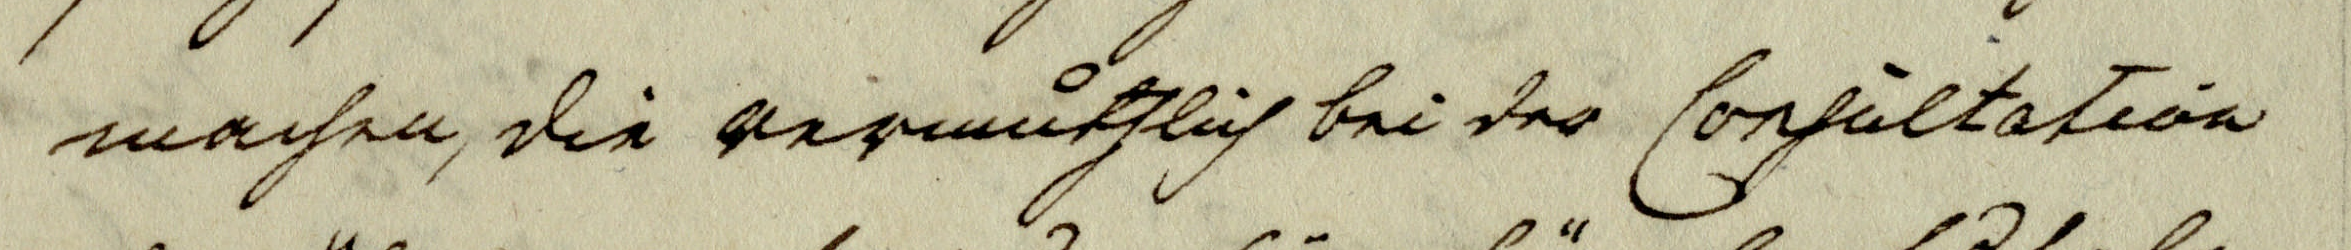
machen, die vermuthlich bei der Consultation
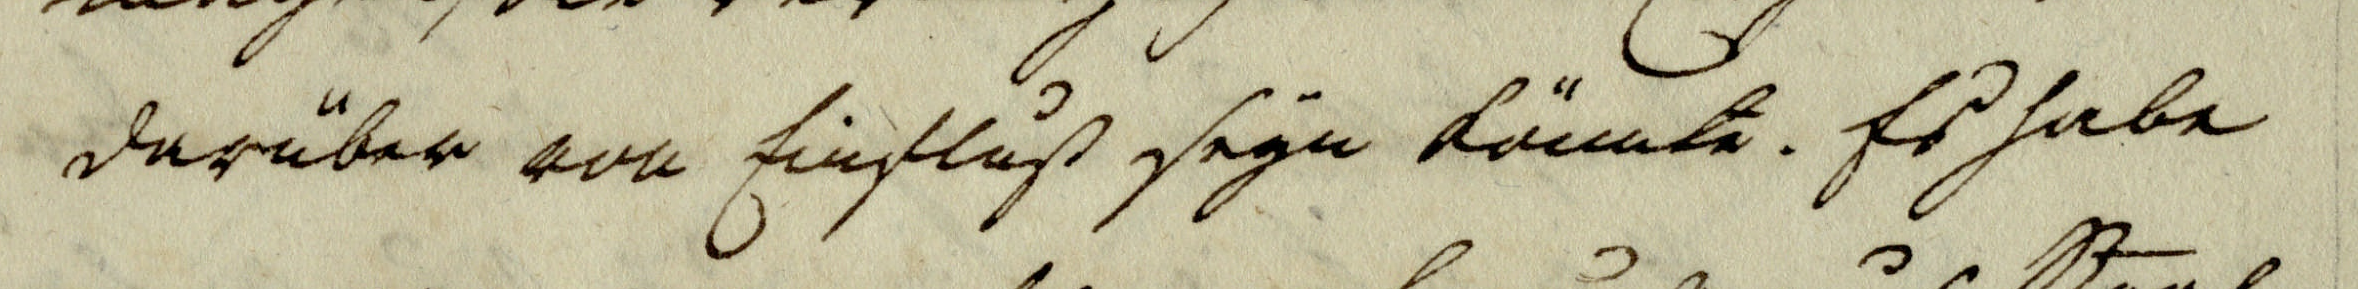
darüber von Einfluß seÿn könnte. Es habe
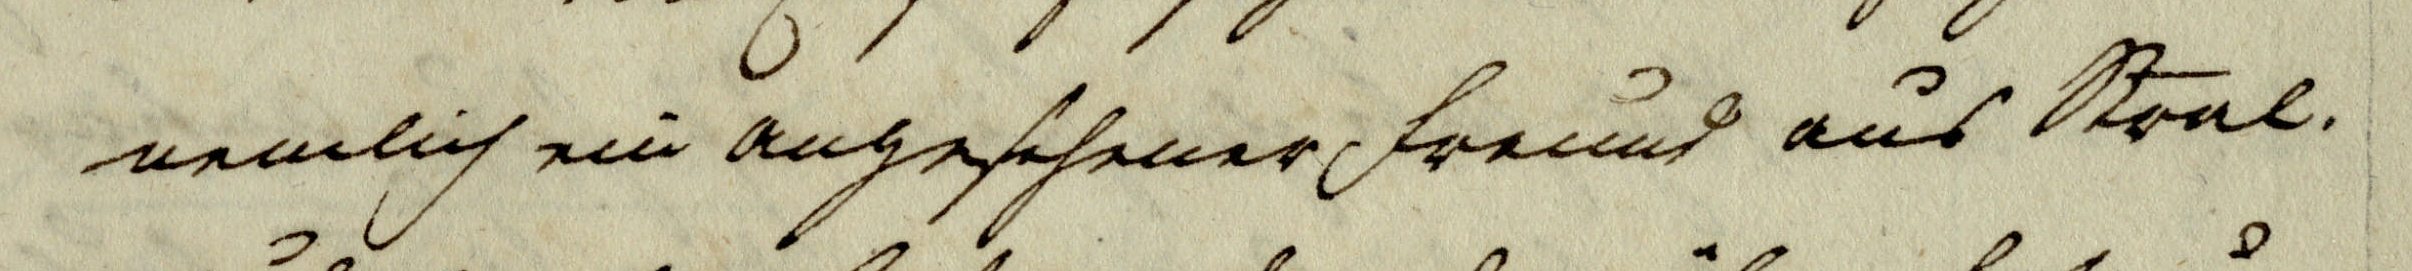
nemlich ein angesehener Freund aus Stral¬
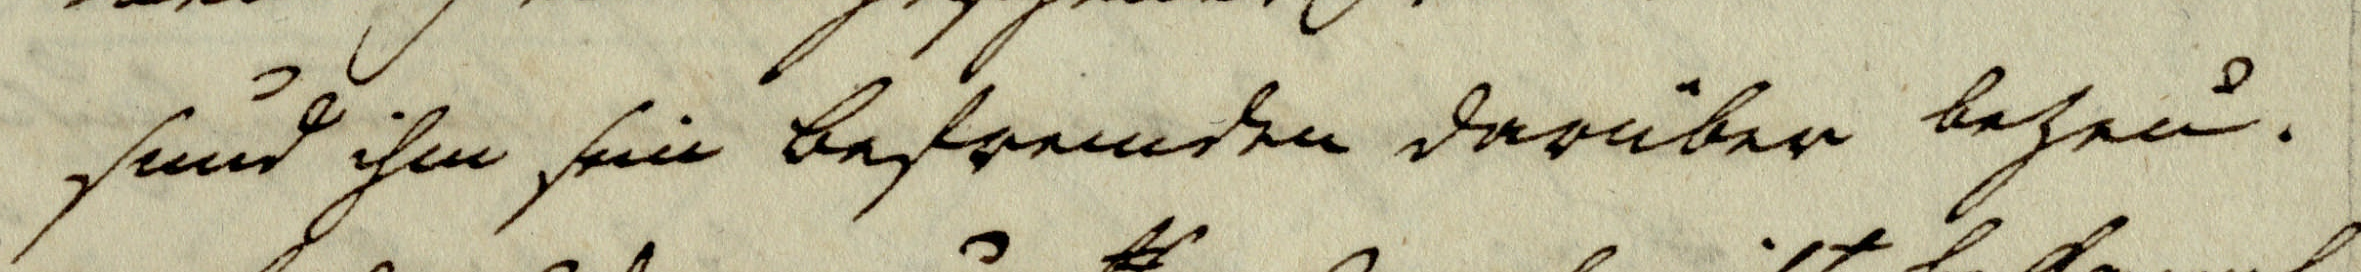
sund ihm sein Befremden darüber bezeu¬
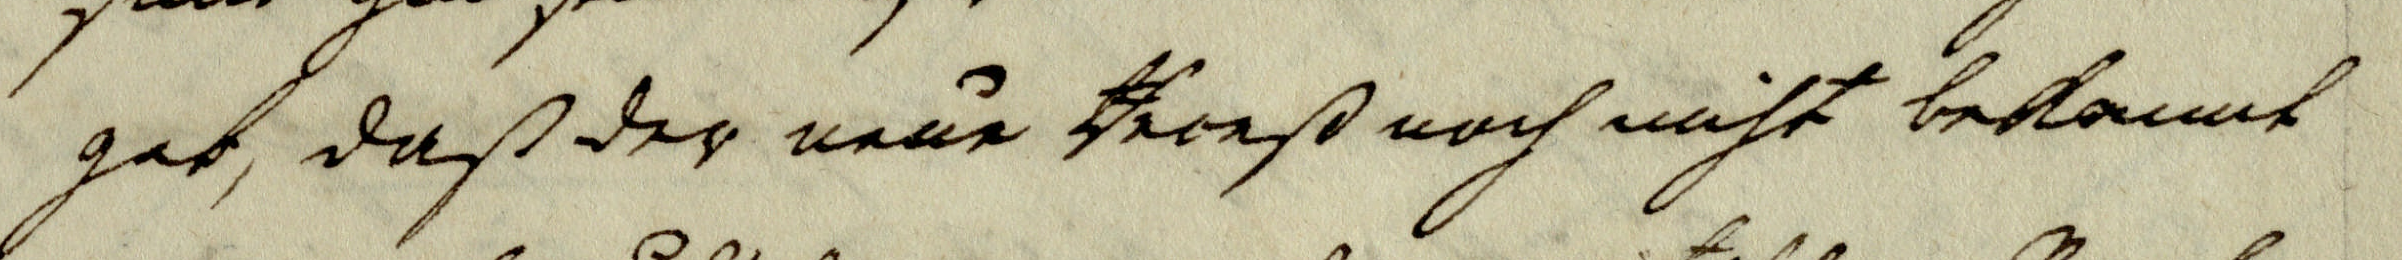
get, daß der neue Receß noch nicht bekannt
